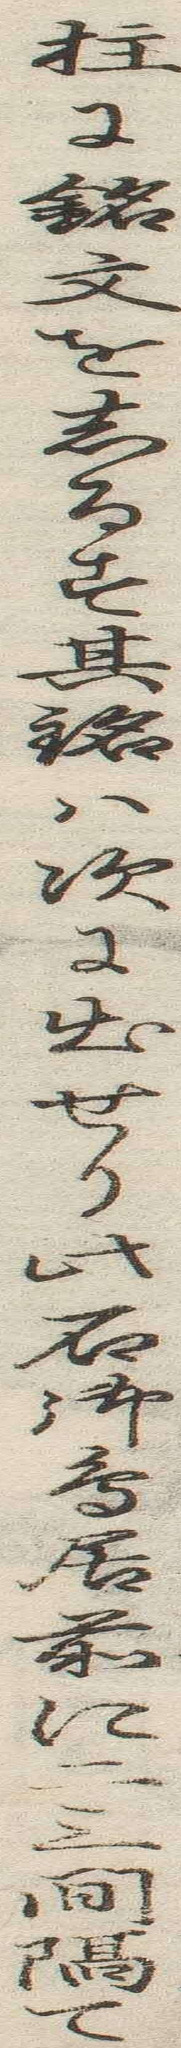柱に銘文をしるす其銘は次に出せり此石御鳥居前に二三間隔て

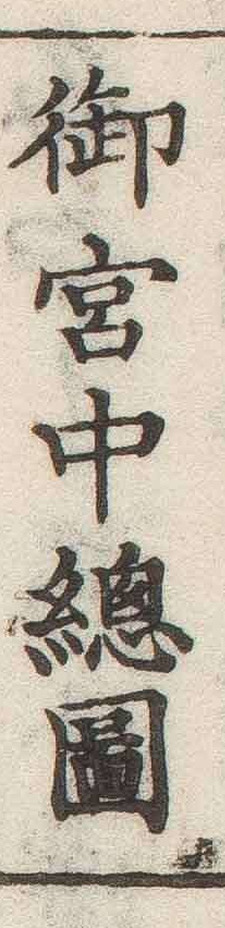御宮中總圖

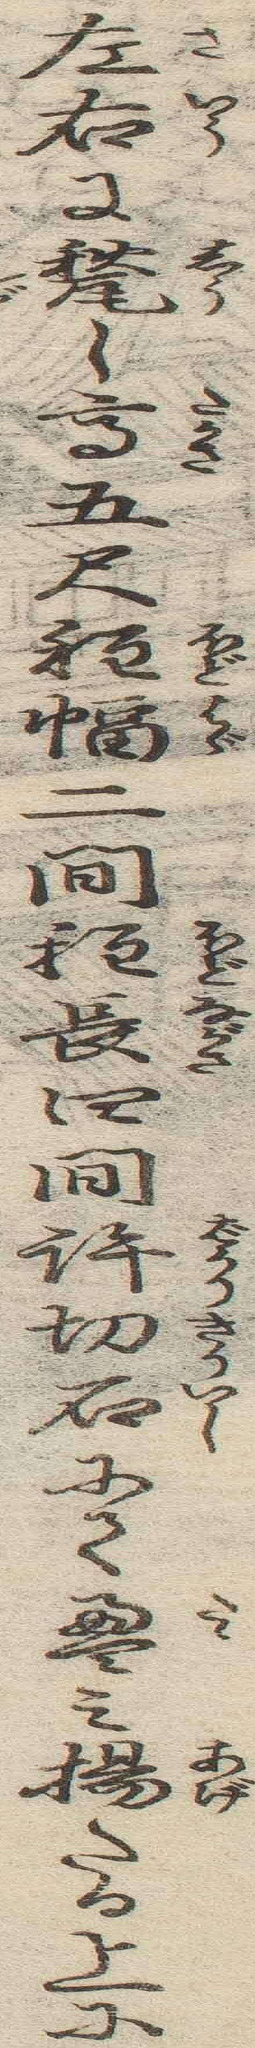左右に甃し高五尺程幅二間程長四間許切石にて畳み揚たる上に
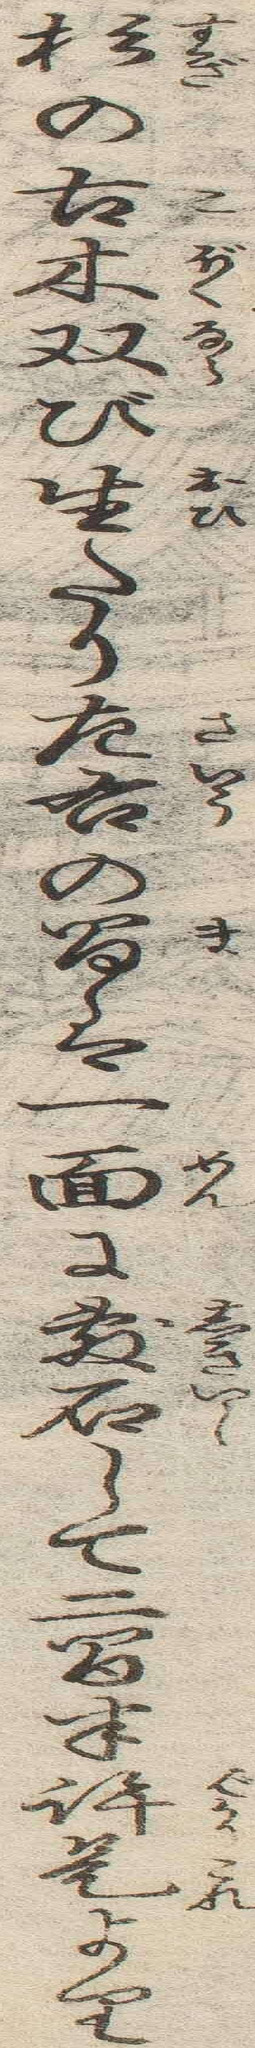杉の古木双び生たり左右の間は一面に敷石して二間半許是より
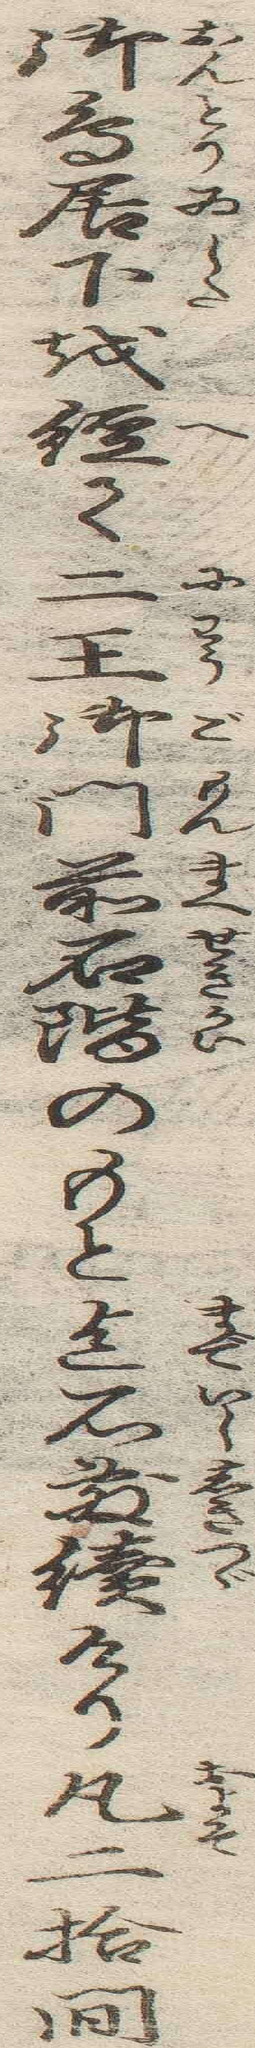御鳥居下を經て二王御門前石階のもと迄石敷續けり凡二拾間
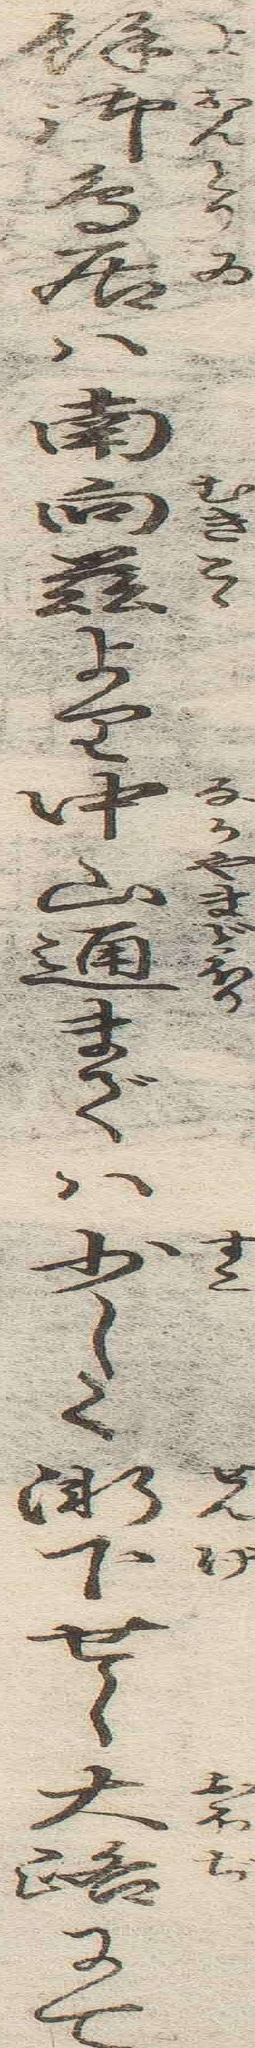餘御鳥居は南向兹より中山道までは少しく漸下せし大路にて
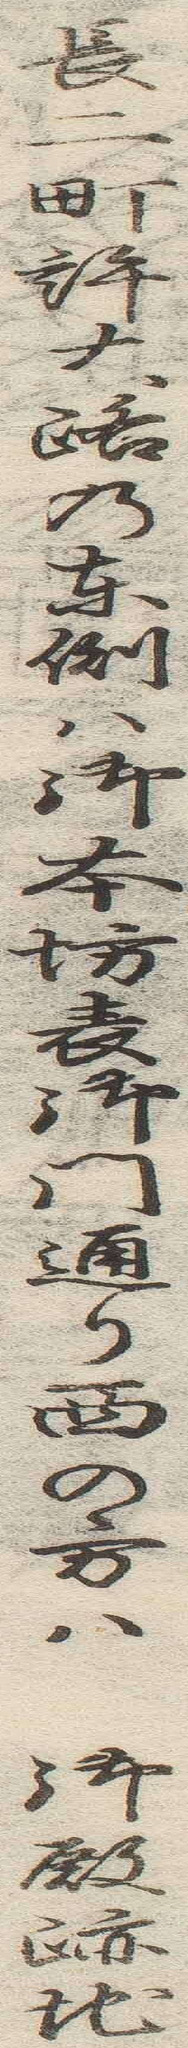長二町許大路の東側は御本坊表御門通り西の方は御殿跡地
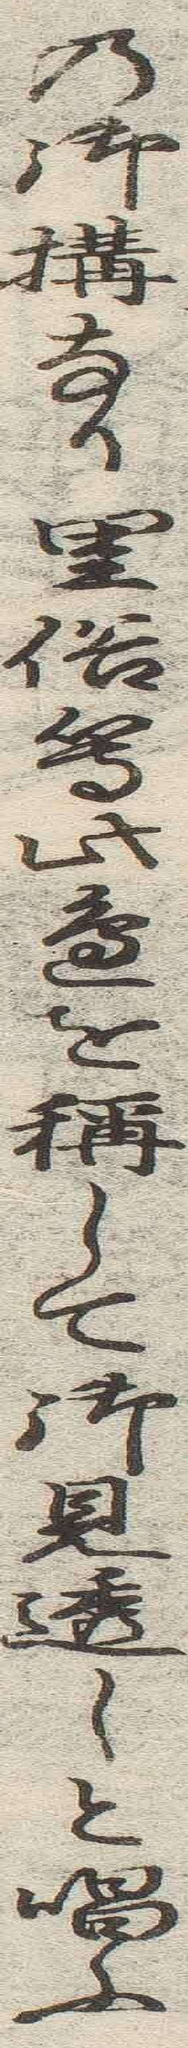の御構なり里俗等此邊を稱して御見透しと唱ふ
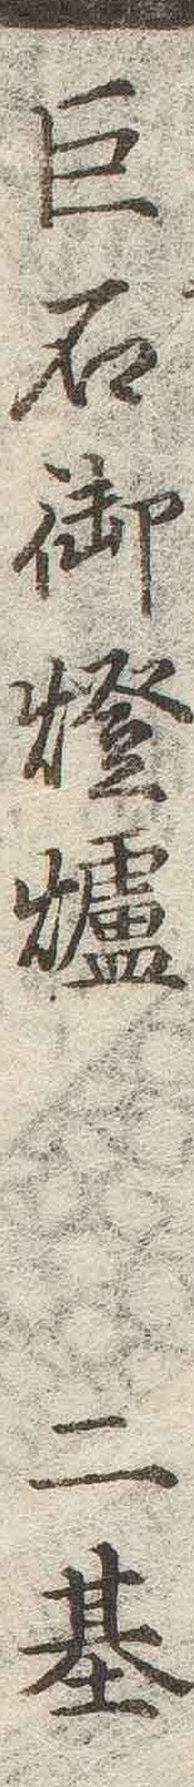巨石御燈爐二基
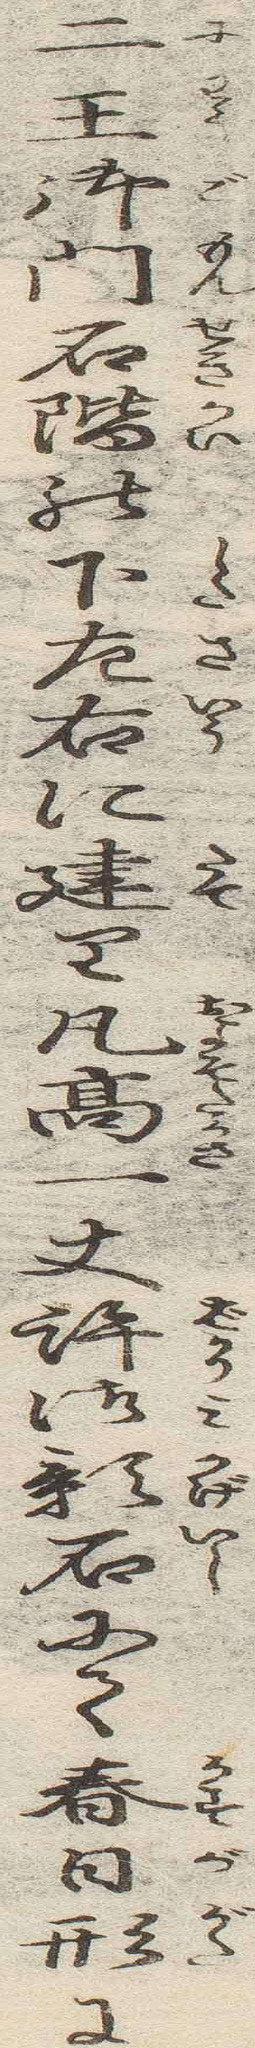二王御門石階の下左右に建り凡髙一丈許御影石にて春日形に
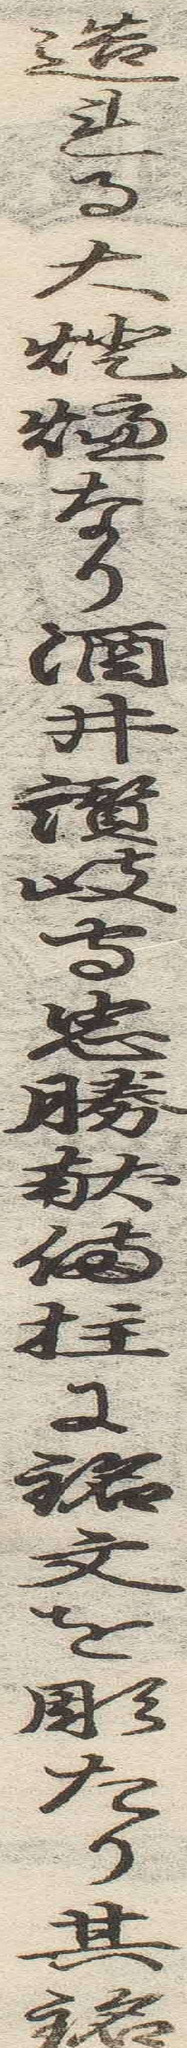造れる大燈爐なり酒井讃岐守忠勝献備柱に銘文を彫たり其銘
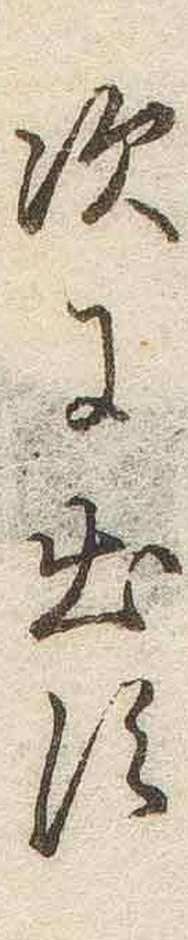次に出す
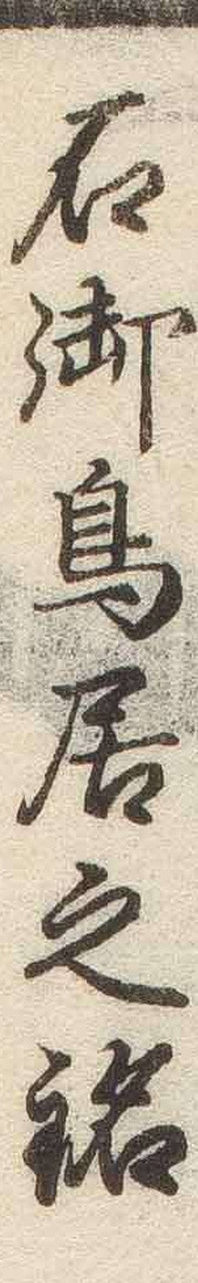石御鳥居之銘
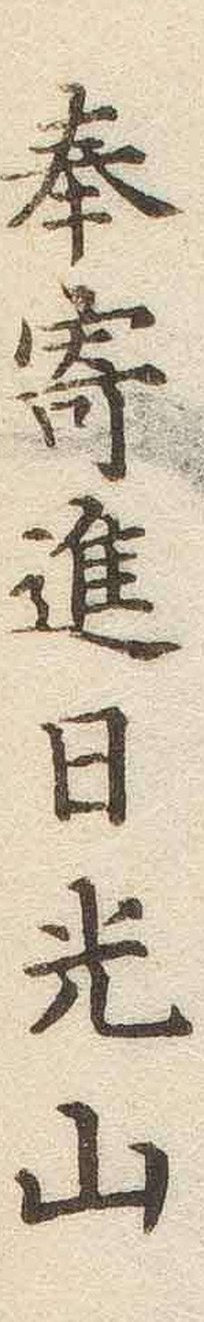奉寄進日光山
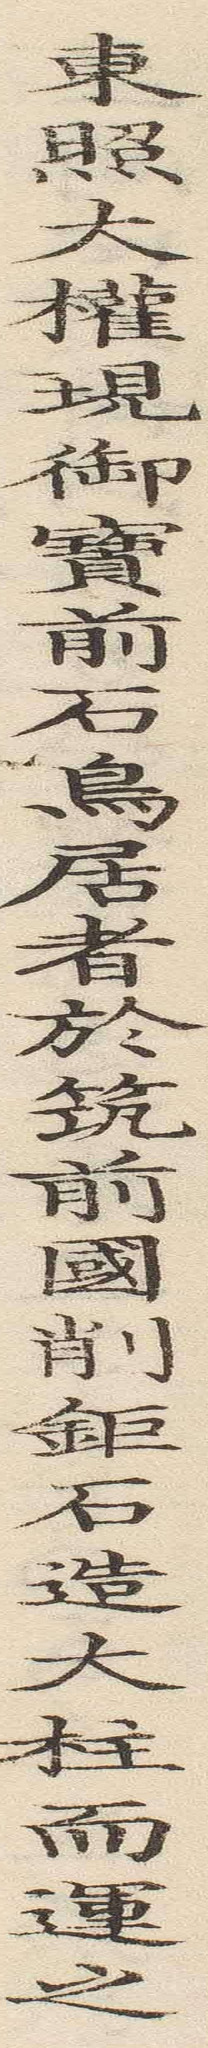東照大權現御寶前石鳥居者於筑前國削鉅石造大柱而運之
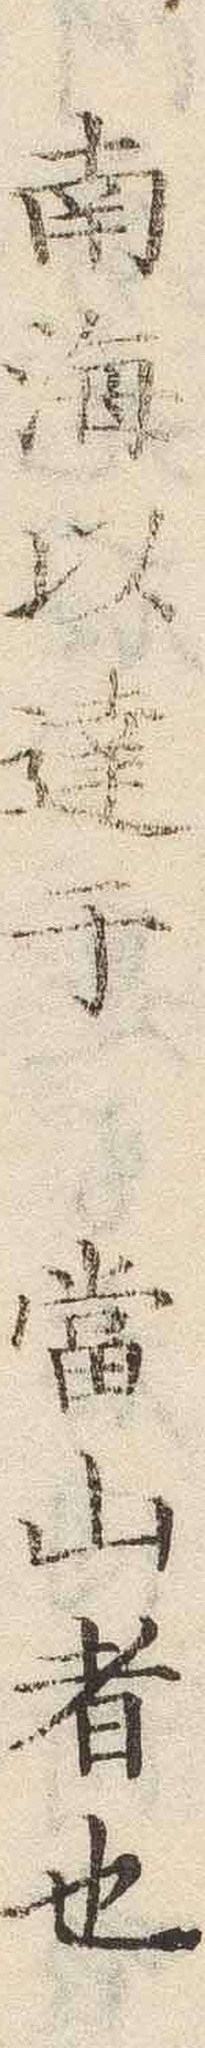南海以達于當山者也
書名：日光山志
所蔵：東京学芸大学附属図書館 国文学研究資料館
